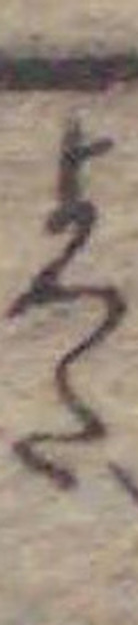よつた
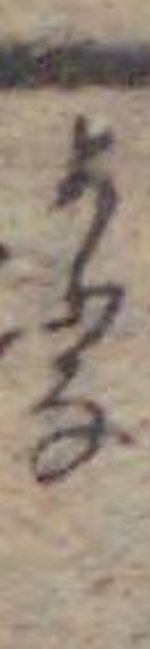よふな
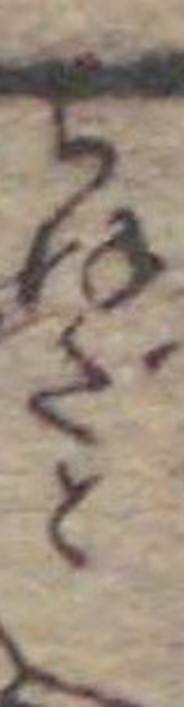かほたと
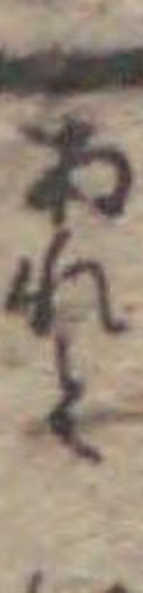あれと
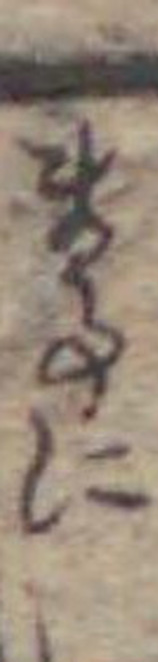ま事に
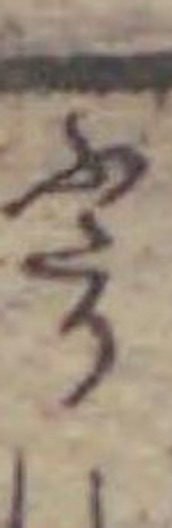ふたり
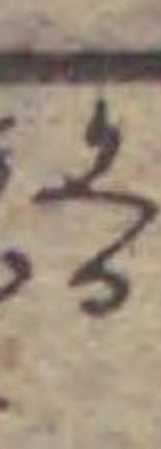かへる
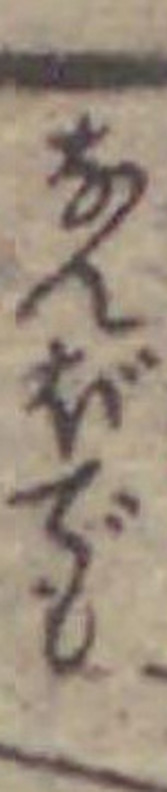なんぼでも
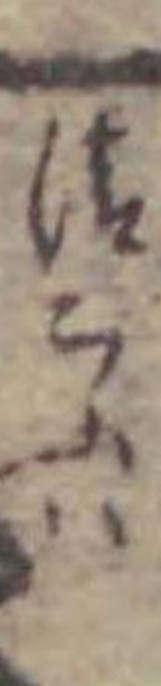清こふは
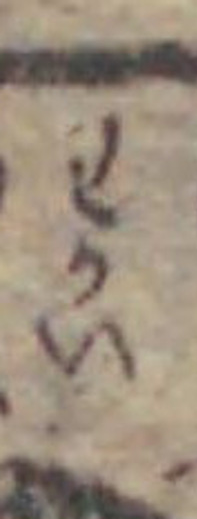わかい
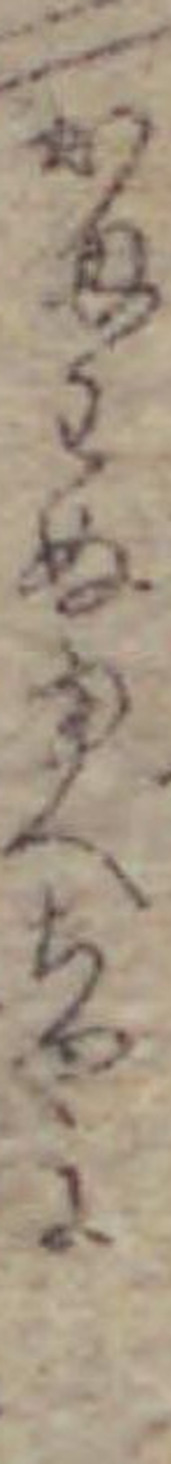かまわぬゆへちやに
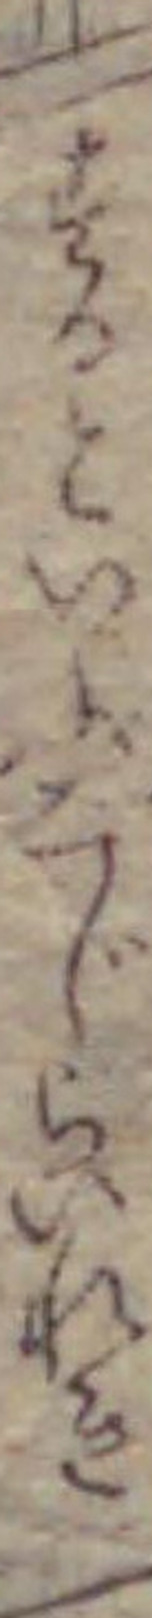するといふこじらいれき
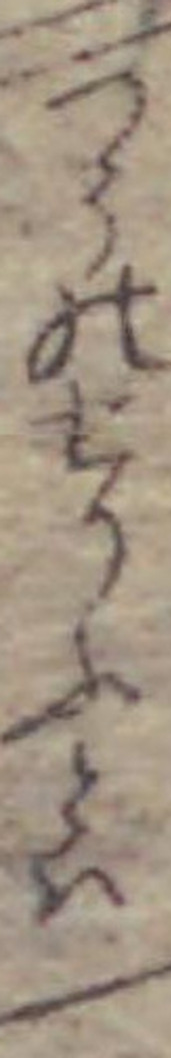つうのせりふとは

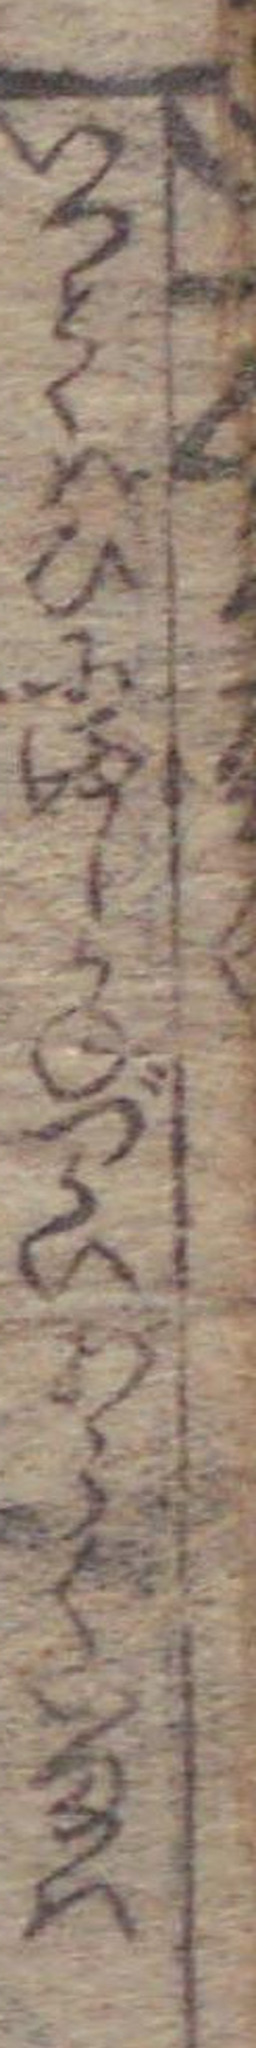いつとくはひに増しかねづかいあらくいまは
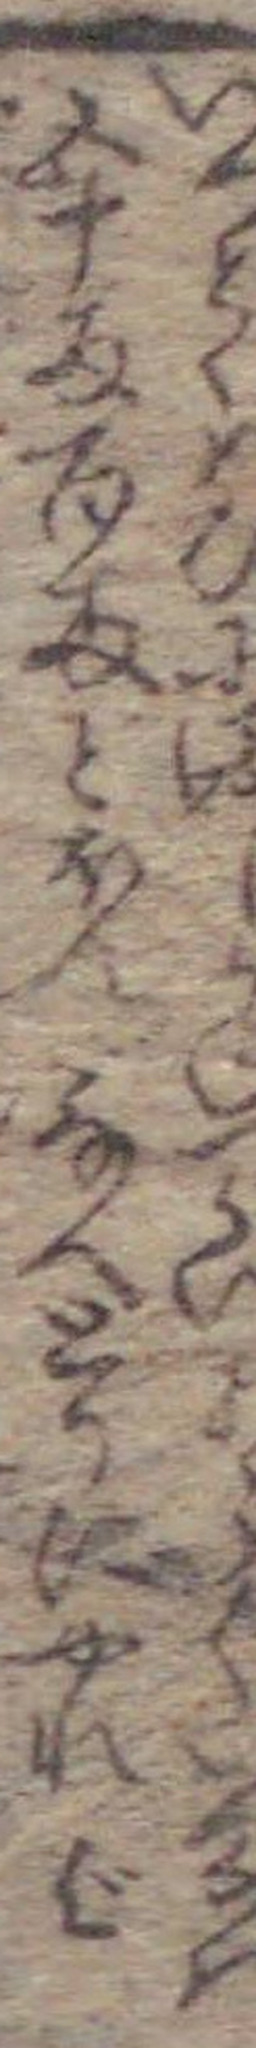五十両百両とほんだなへとりにやれば
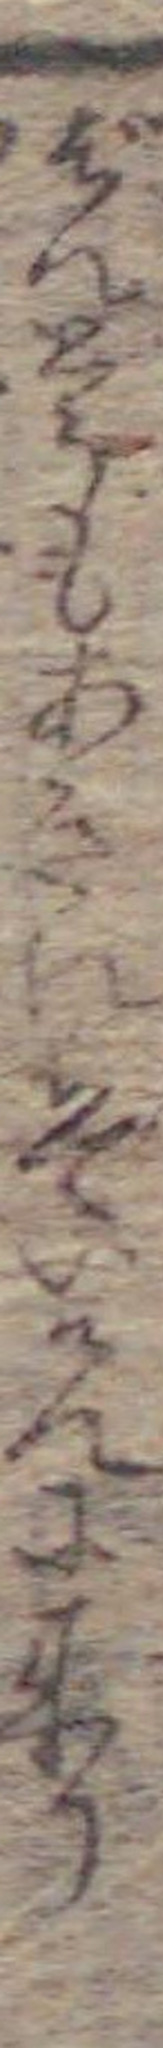ばんとうもあきれはていけんに来り
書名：見通占 : 3巻
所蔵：国立国会図書館 National Diet Library, JAPAN
